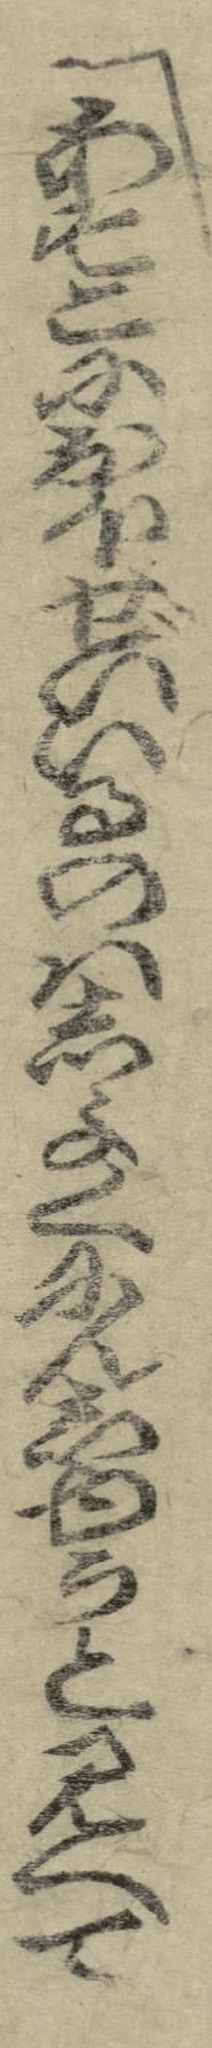〽あそこにおほぜいいるのはしよくにんしゆうと見へて
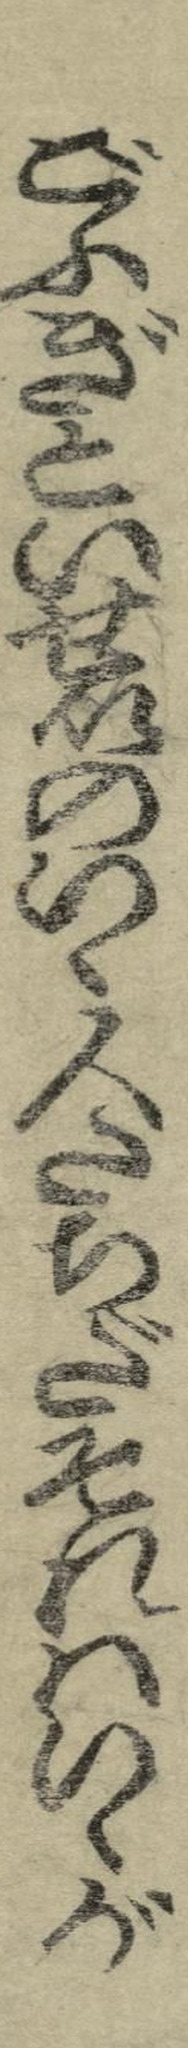ごふぎといせいのいゝ人たちだそれはいゝが
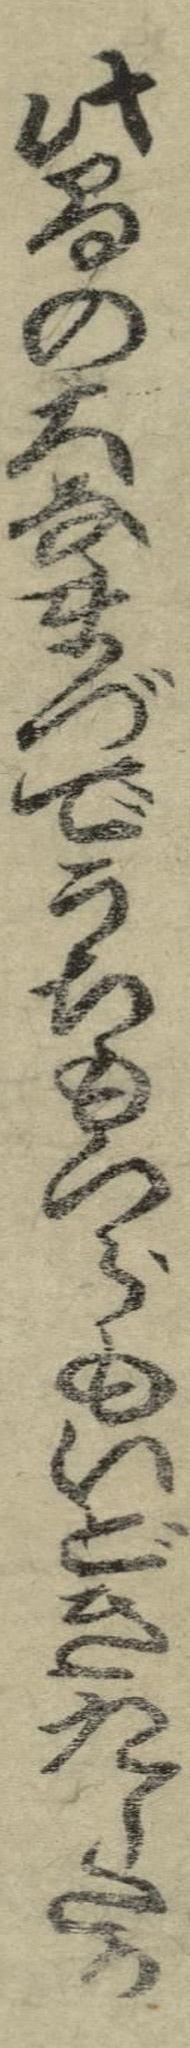此間の大なまづでうちもくらもいごきたしたか
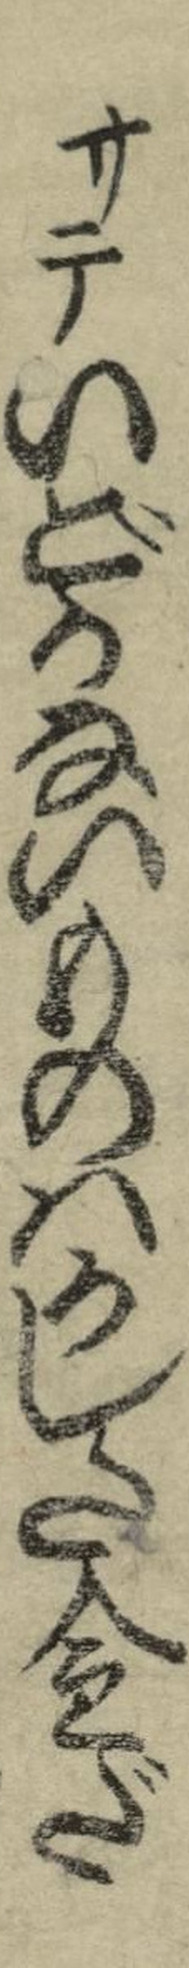サテいごかないものはかした金だ
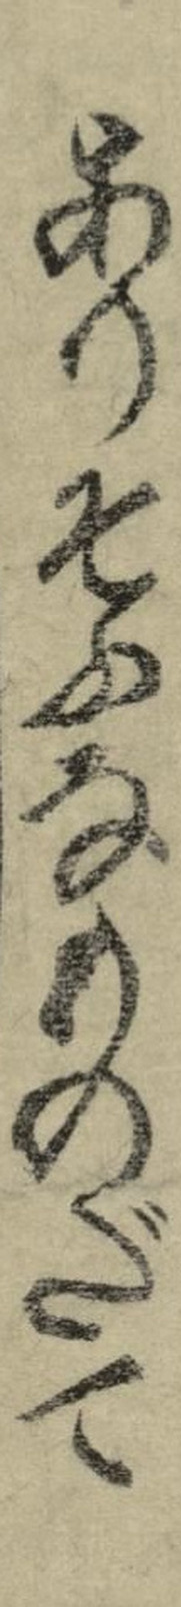ありそふなものだて
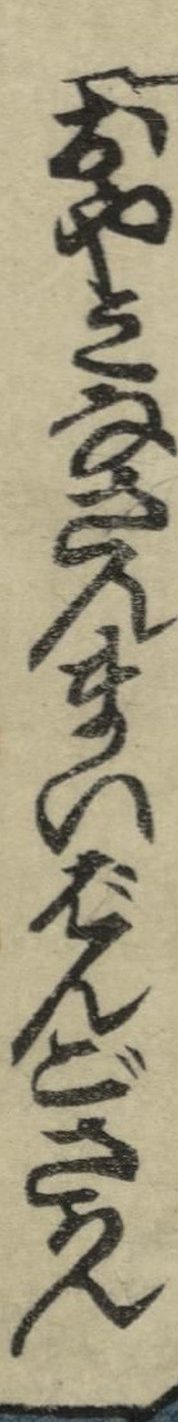〽おやみなさんまいばんごさかん
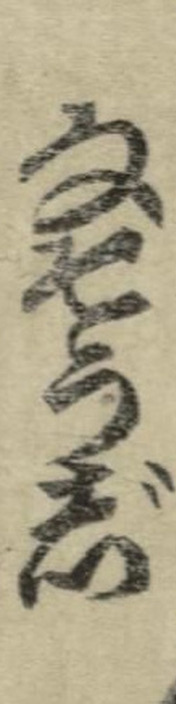なそうじ
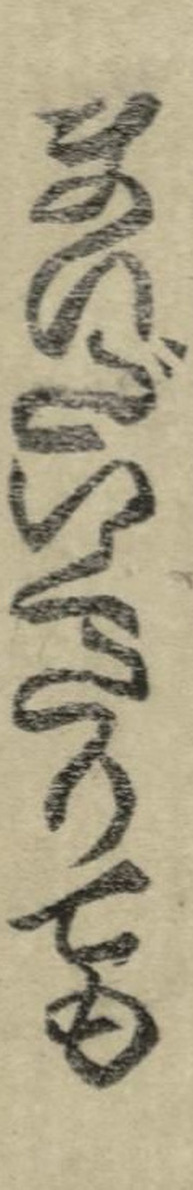まいだいくたりても
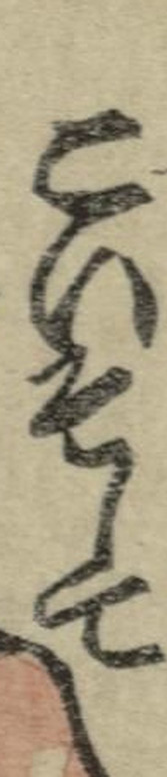こいそして
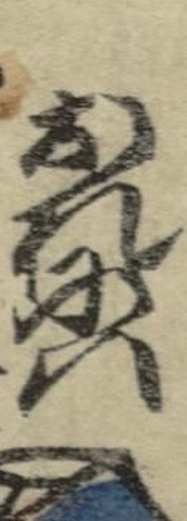おれには
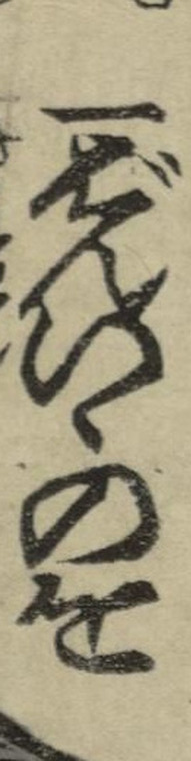一ばんいゝのを
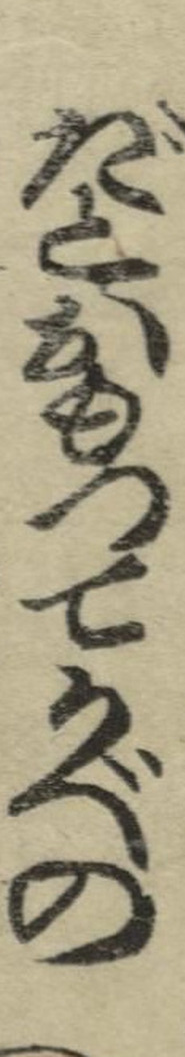だとおもつてかべの
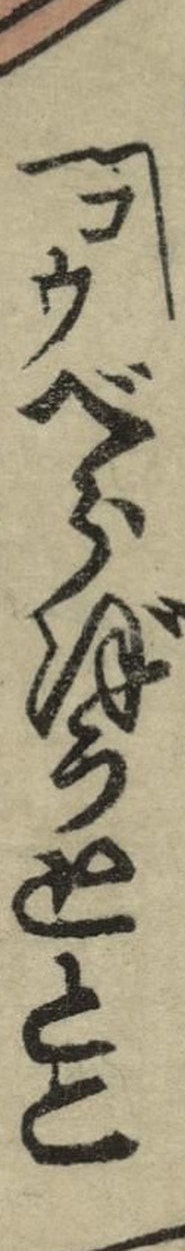〽コウべらぼうととこ
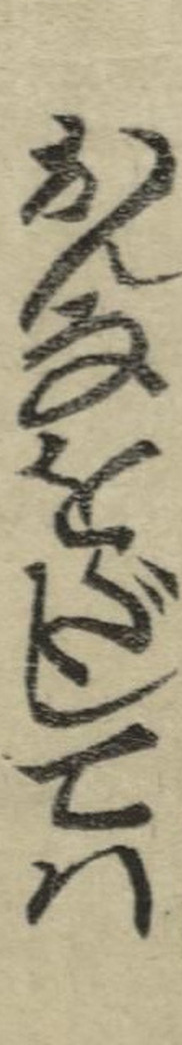おんなをだしては
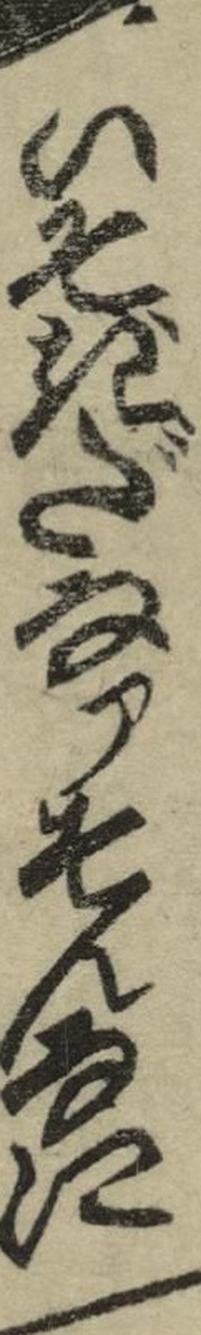いそぎだなァそんなに
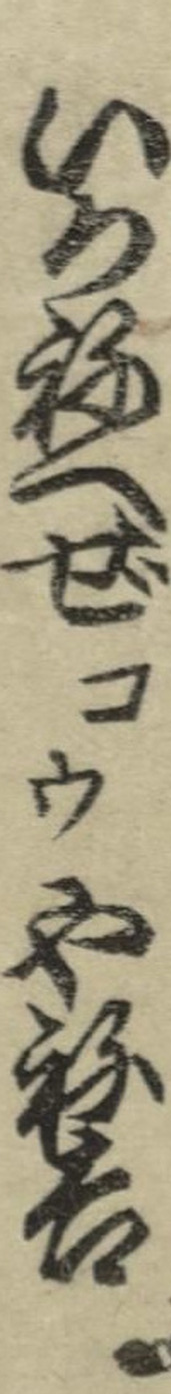いかねへぜコウやね吉
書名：瓢箪
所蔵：東京大学地震研究所図書室 Earthquake Research Institute Library, The University of Tokyo, JAPAN
